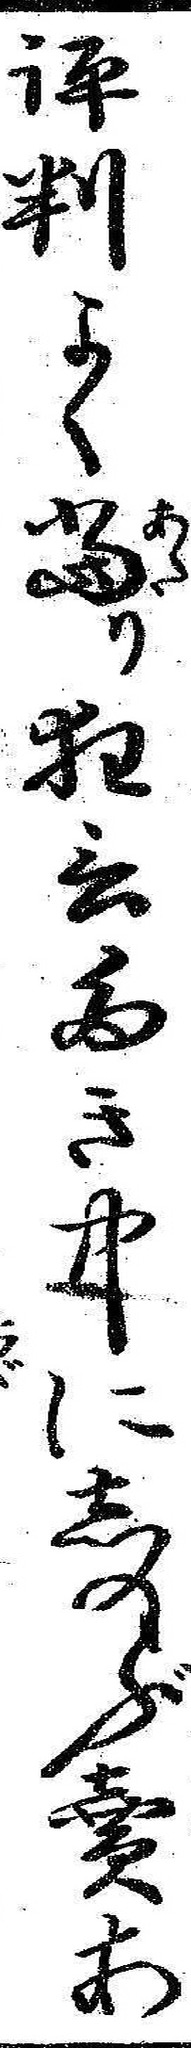評判よく当り狂言多き中にしのぶ売あ
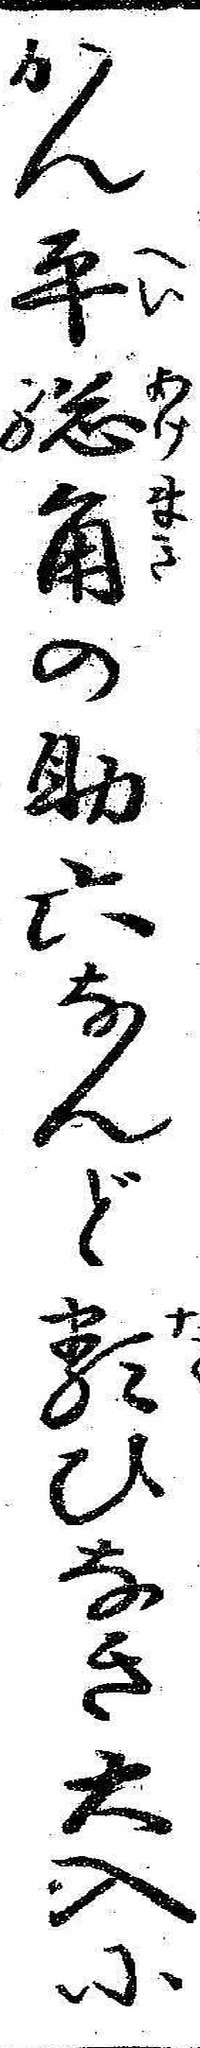かん平総角の助六なんど類ひなき大入に
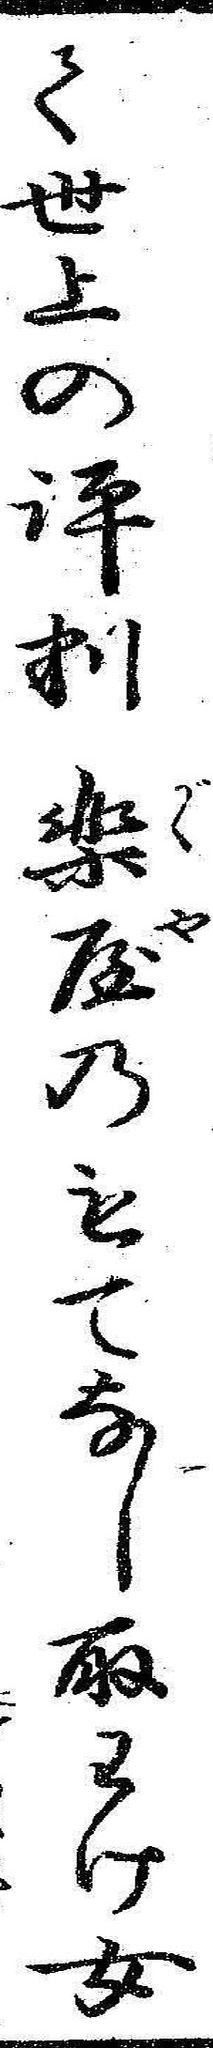て世上の評判楽屋のもてなし取わけ女
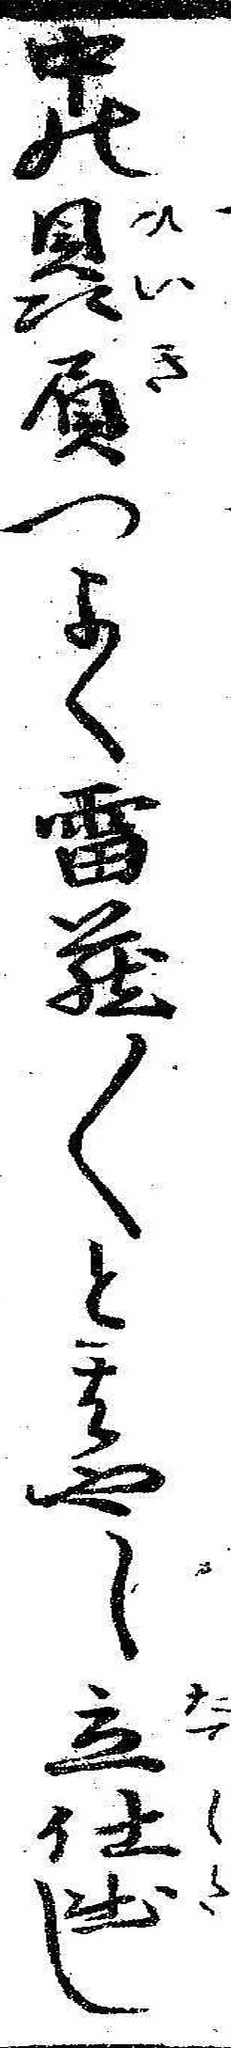中の贔屓つよく雷蔵〱とはやし立仕出し
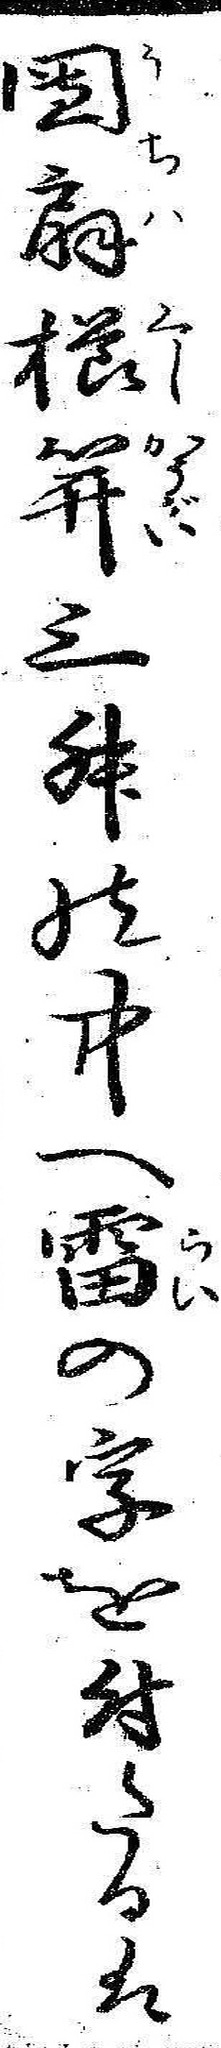団扇櫛笄三升の中へ雷の字を付たるは
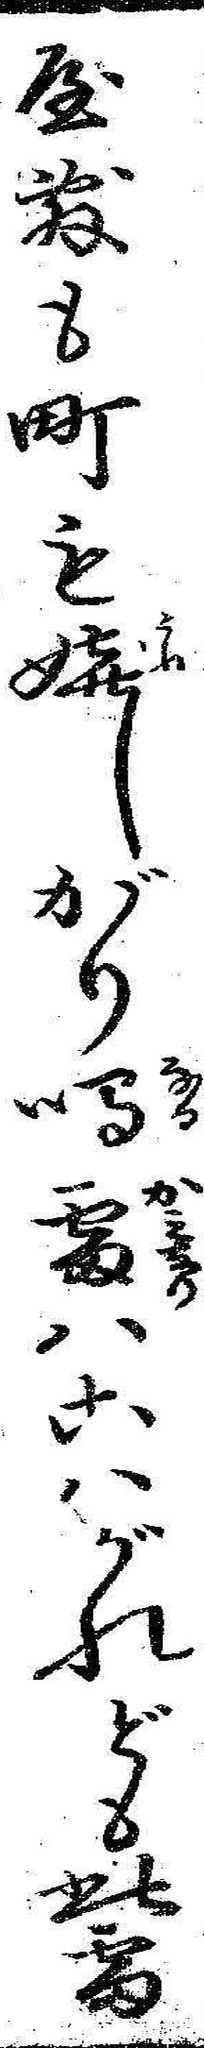屋敷も町も嬉しがり鳴雷はこはがれども此雷
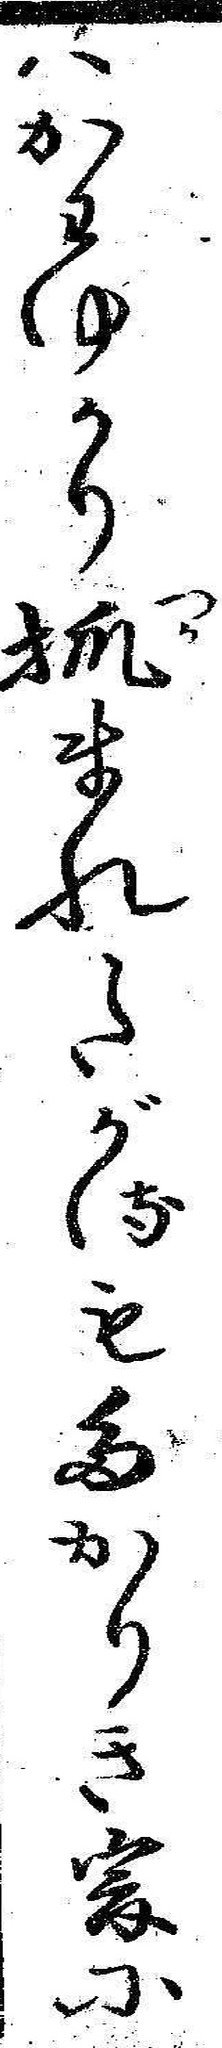はかわゆかり抓まれたがるも多かりき爰に

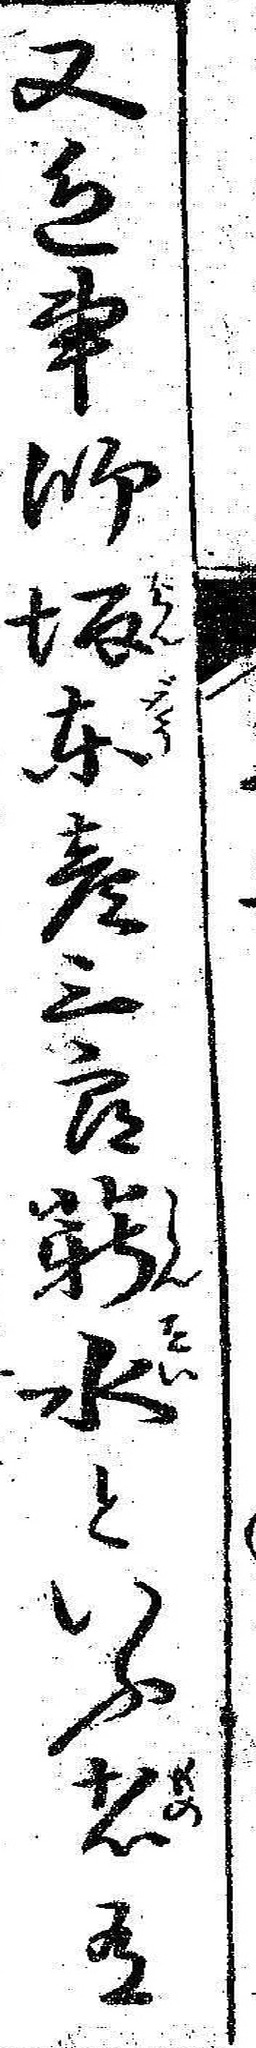又色事師坂東彦三郎薪水といふ者有
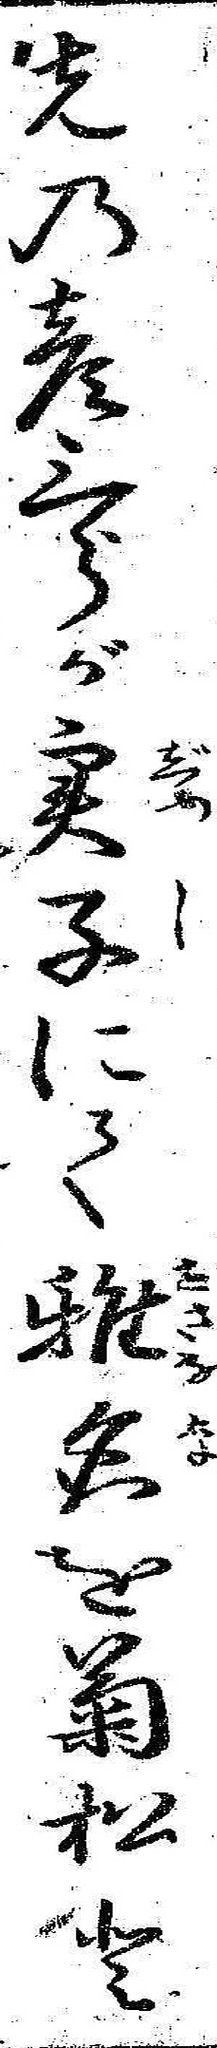先の彦三郎が実子にて稚名を菊松と
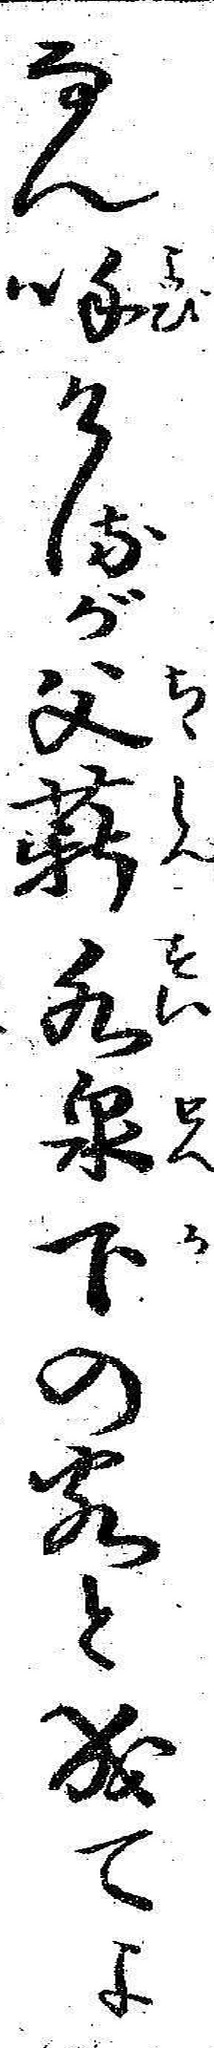なん呼けるが父薪水泉下の客と成てよ
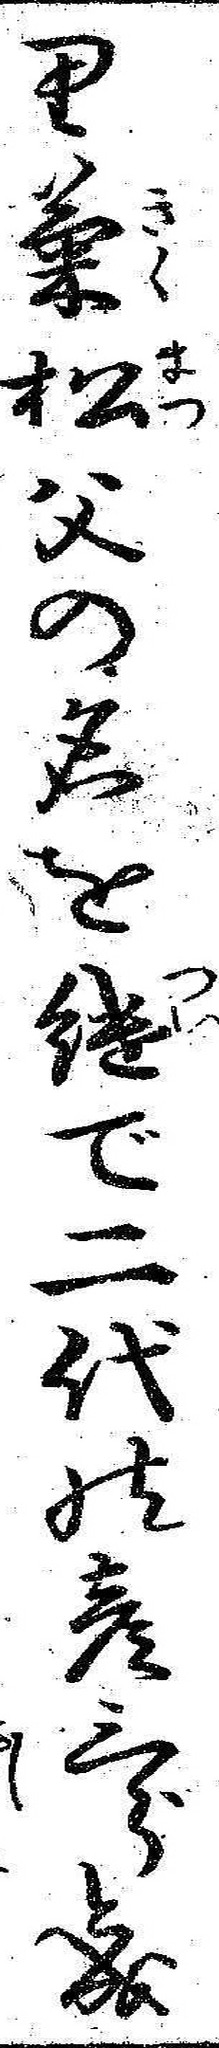り菊松父の名を継で二代の彦三郎らと成
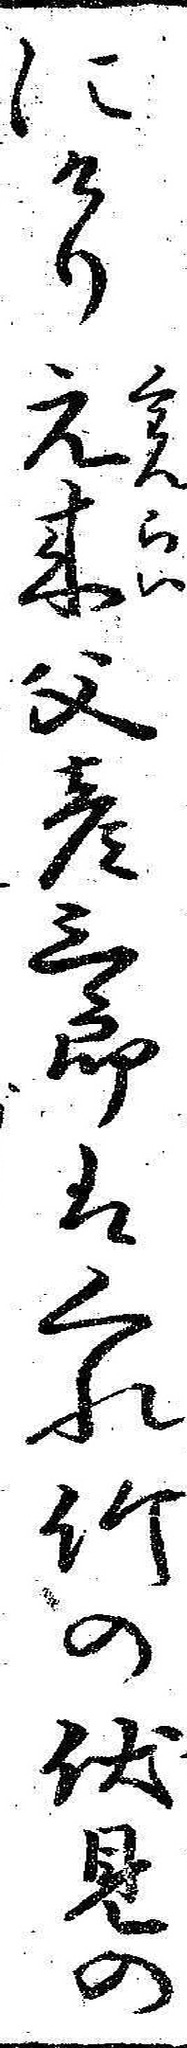にけり元来父彦三郎はくれ竹の伏見の
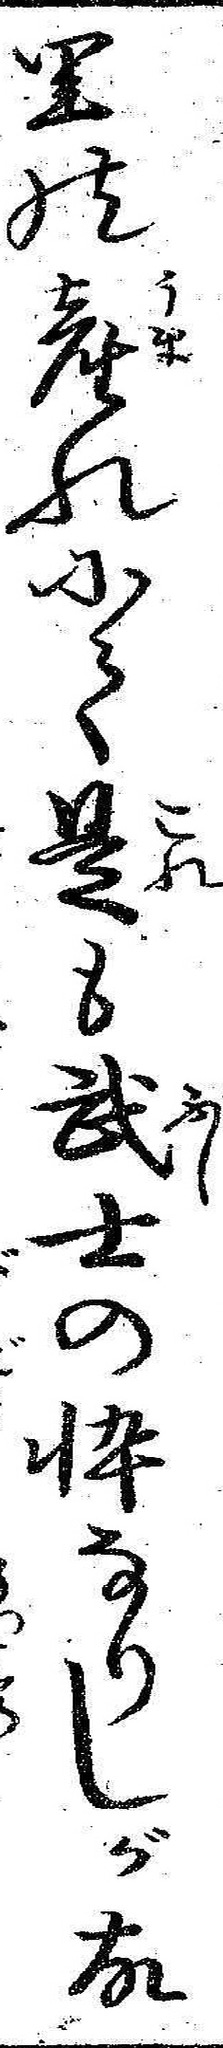里の産れにて是も武士の枠なりしが故
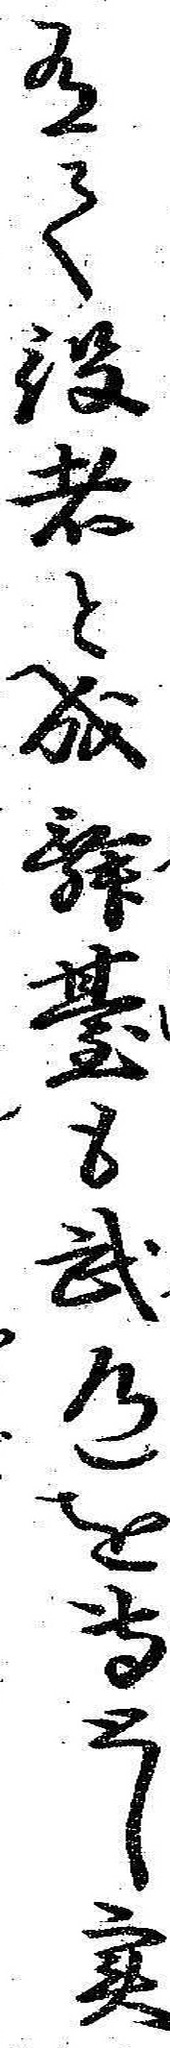有て役者と成舞台も武道を専とし実
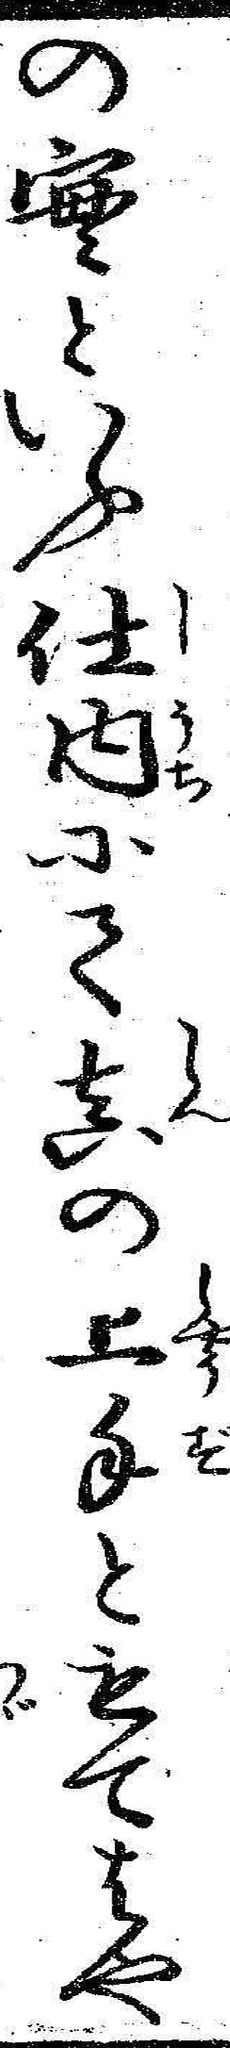の実といふ仕内にて真の上手ともてはや
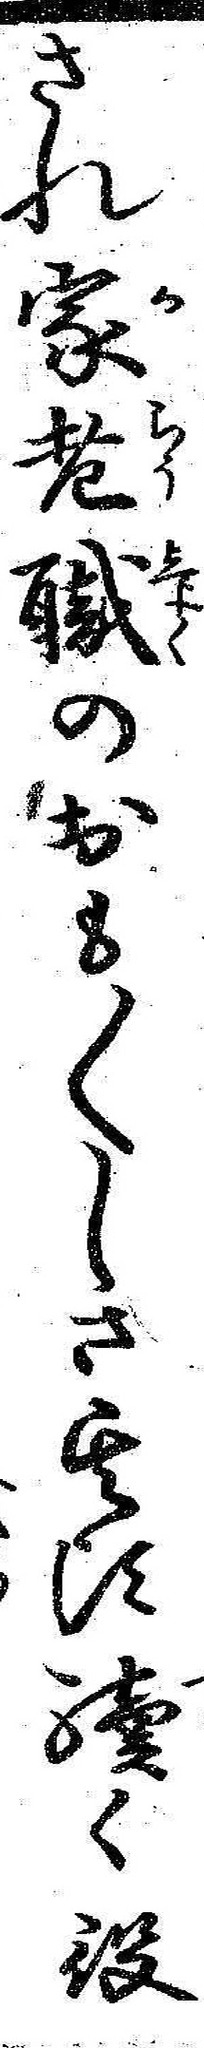され家老職のおも〱しさ其頃続く役
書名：根無草後編
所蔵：国文学研究資料館
